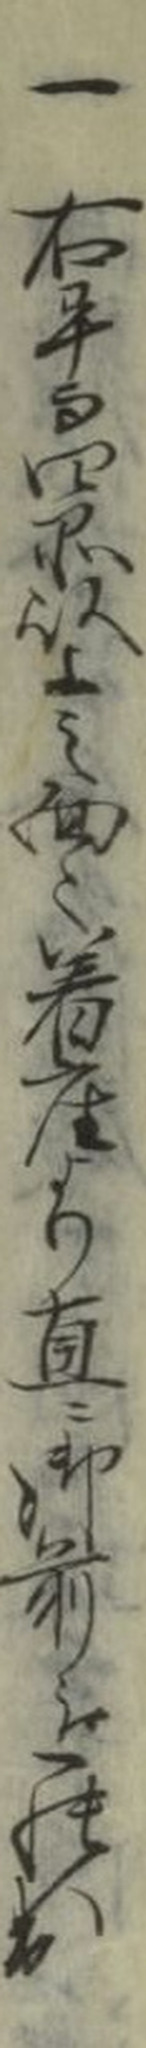一右畢而四品以上之面々着座より直に御前え罷出
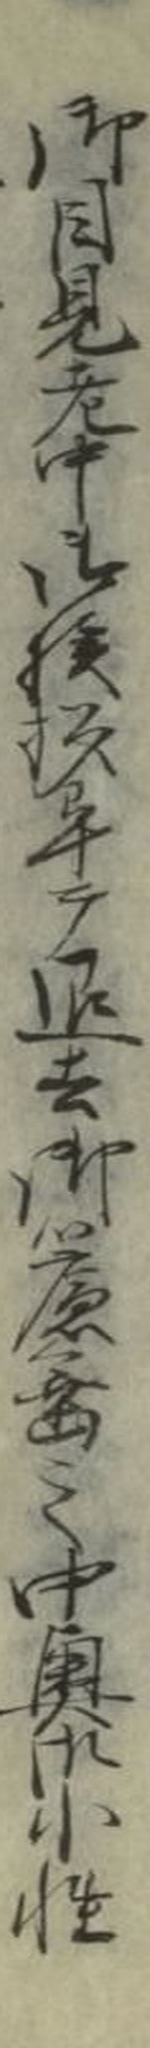御目見老中御挨拶畢て退去御簾垂之中奥御小性
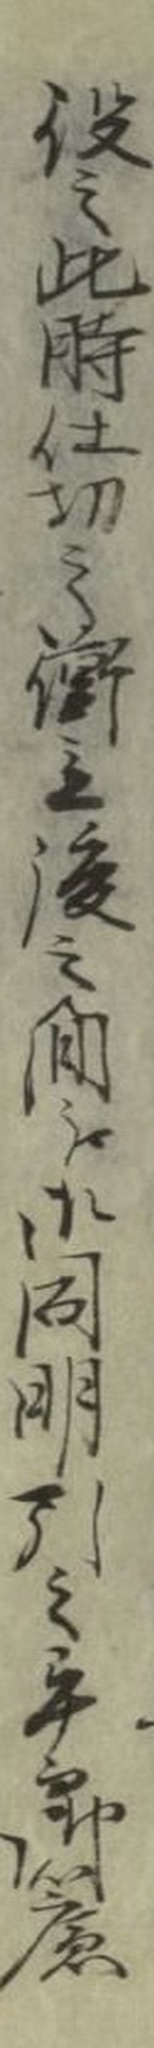役之此時仕切之衝立後之間え御同朋引之畢而御簾
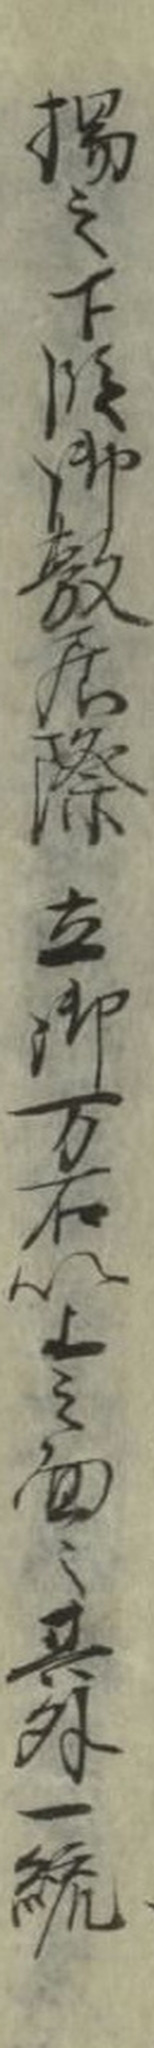揚之下段御敷居際在御万石以上之面々其外一統
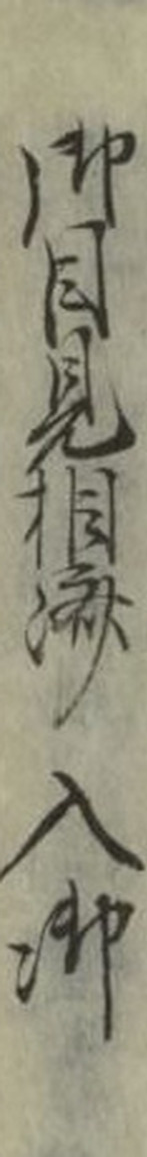御目見相済入御
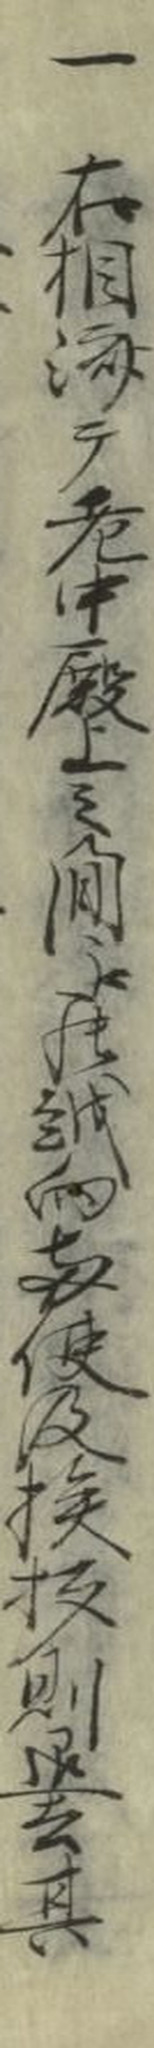一右相済て老中殿上之間え罷越而両使及挨拶則退去其
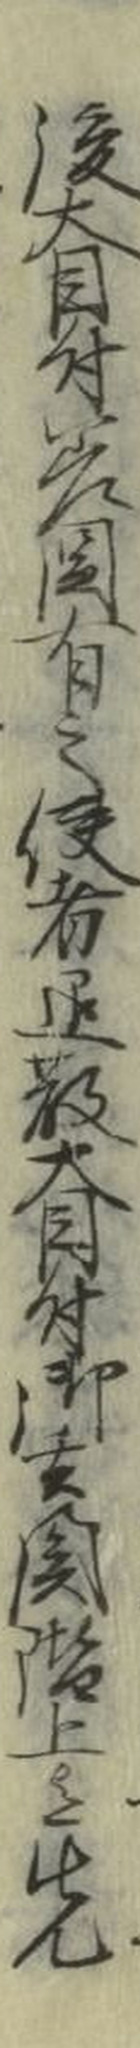後大目付差図有之使者退散大目付御玄関階上迄先
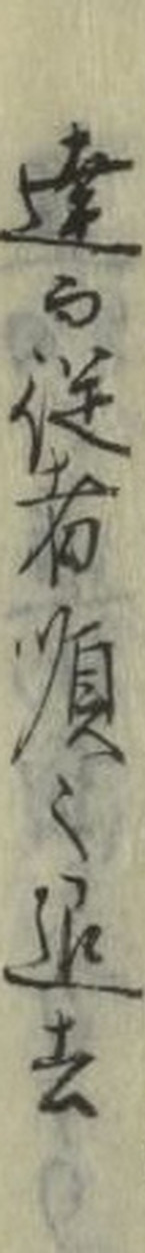達而従者順々退却
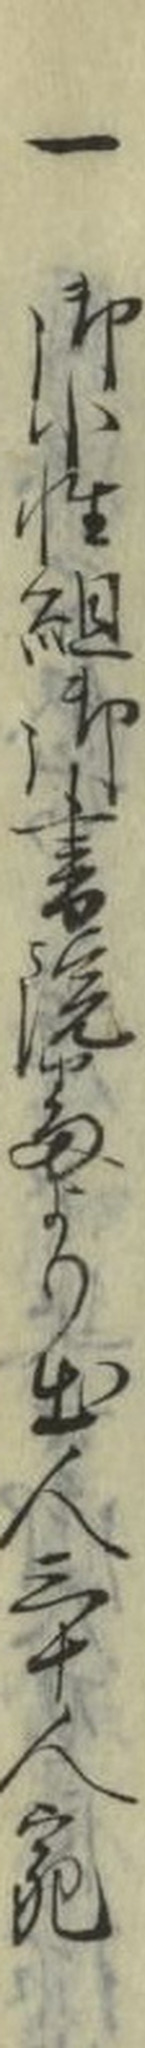一御小性組御書院番より出人三十人宛
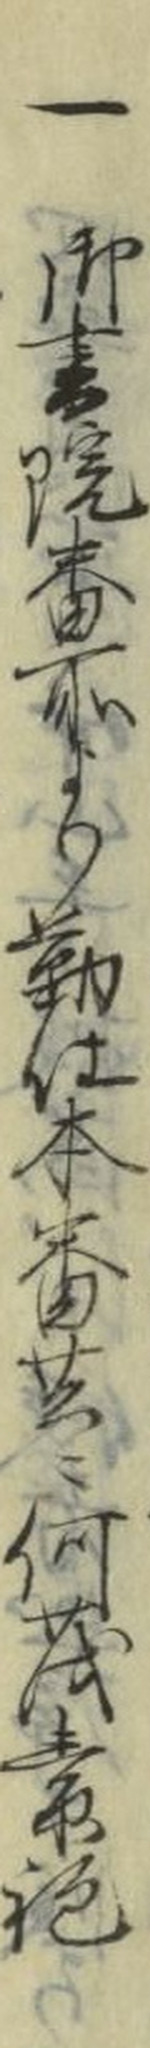一御書院番所より勤仕本番共に何も素袍
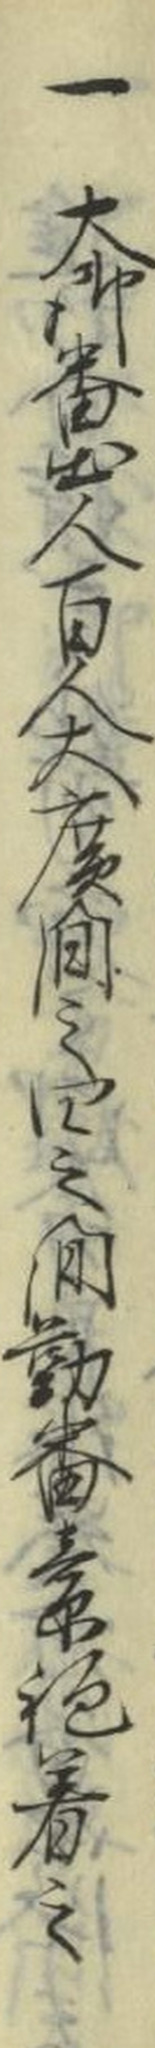一大御番出人百人大広間之四之間勤番素袍着之
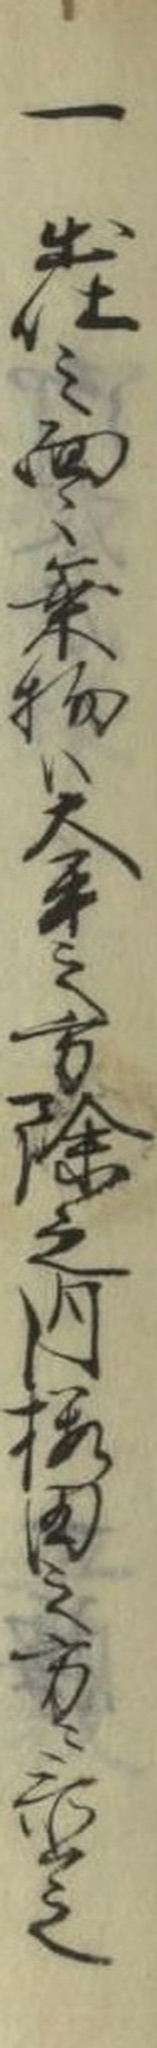一出仕之面々乗物は大手之方除之内桜田之方に置之
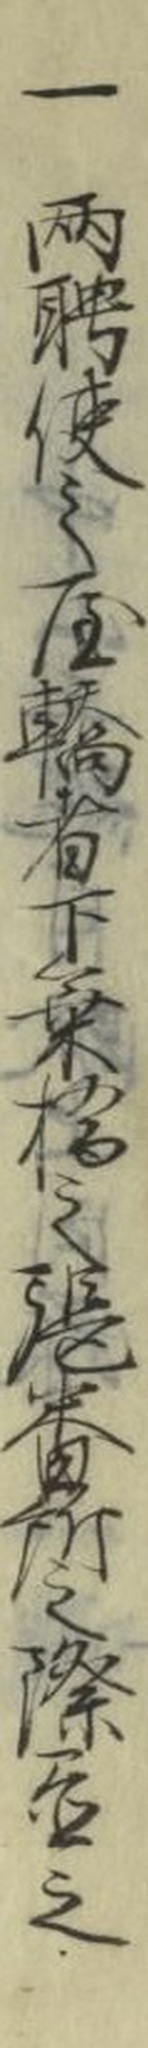一両聘使之屋轎は下乗橋之張番所之際置之
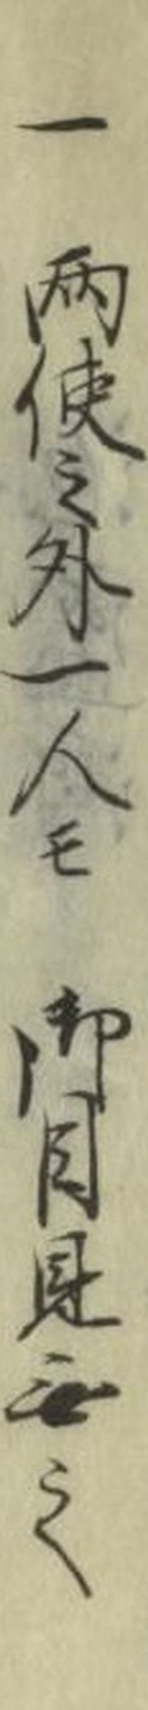一両使之外一人も御目見無之
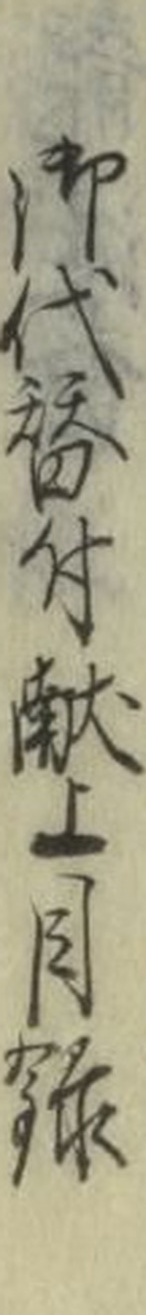御代替付献上目録
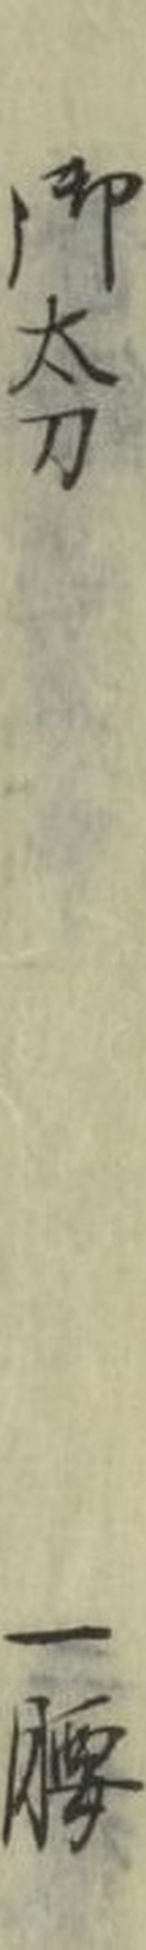御太刀一腰
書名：宝永七庚寅年琉球国来聘使日記
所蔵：University of the Ryukyus Library
